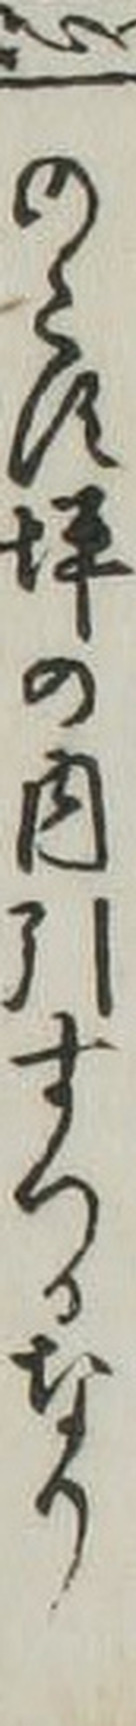りのこす坪の内引すつるなり
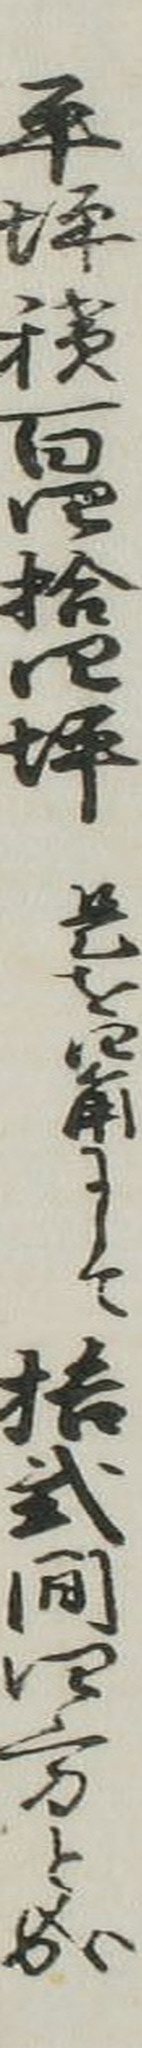平坪積百四拾四坪是を四角にして拾弐間四方と成
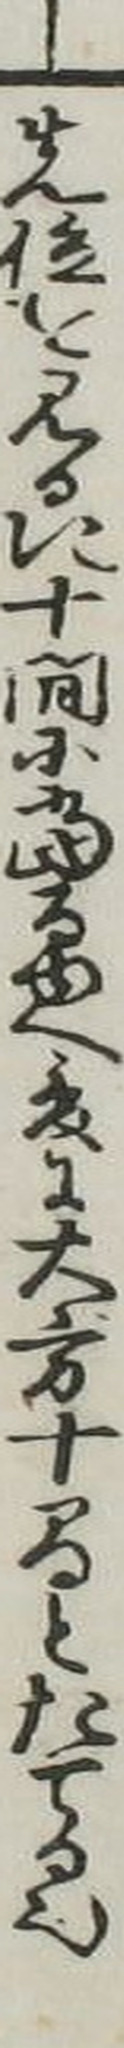先位を見るに十間に当るゆへ爰に大方十間とたてる也
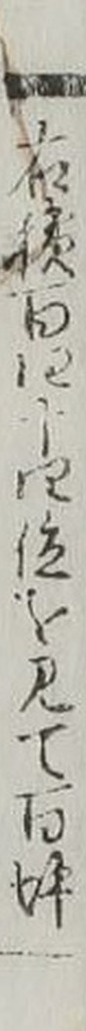右積百四十四位を見て百坪
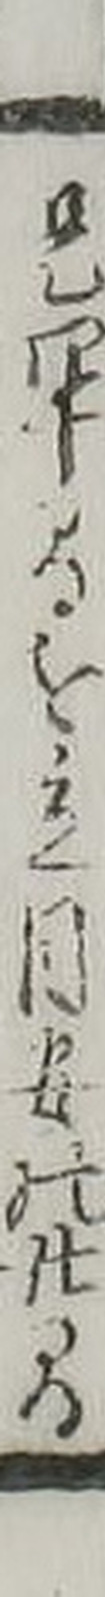是四十間を立目安の廿間
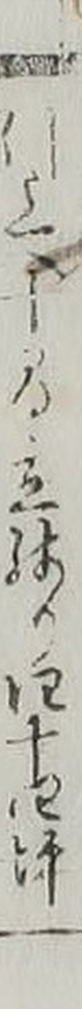残引上し間立残り四十四坪
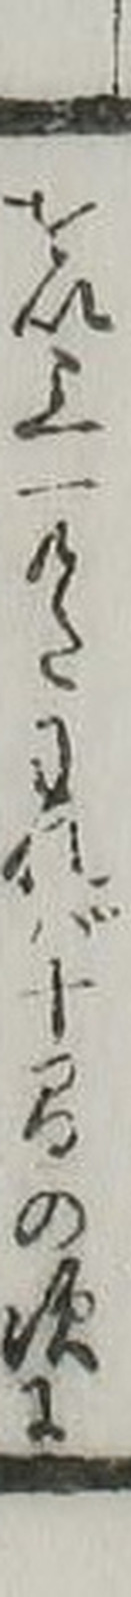を以上一けたわれば十間の次に
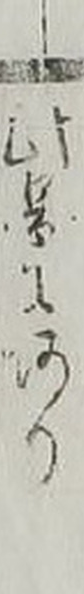此図にあり
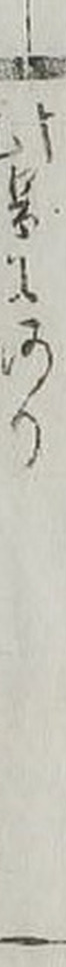此図にあり
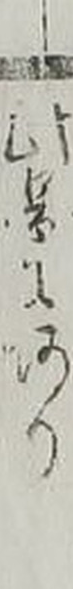此図にあり
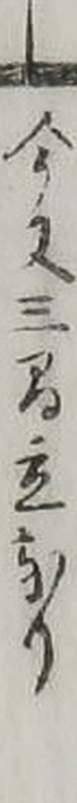今又三間立なり
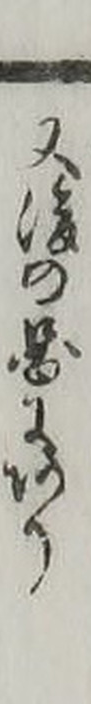又後の図にあり
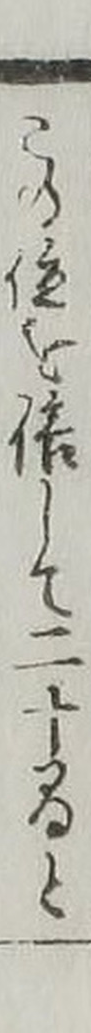この位を倍して二十間と
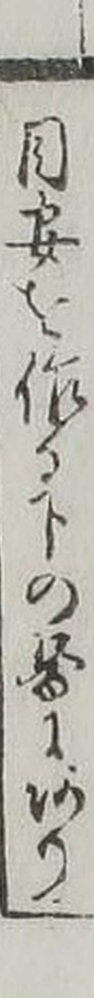目安を作る下の図にあり
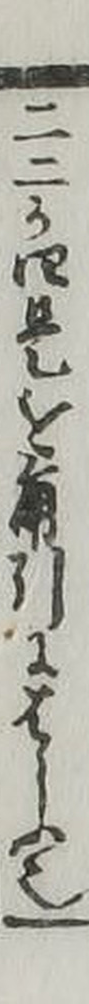二二か四是を角引にはらふ也
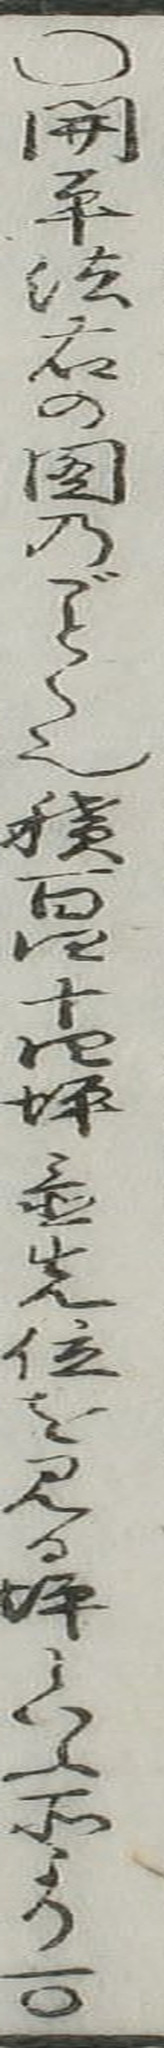○開平法右の図のごとく也積百四十四坪置先位を見る坪といふ所より一〇
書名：宝玉塵劫記
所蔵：東京学芸大学教育コンテンツアーカイブ
